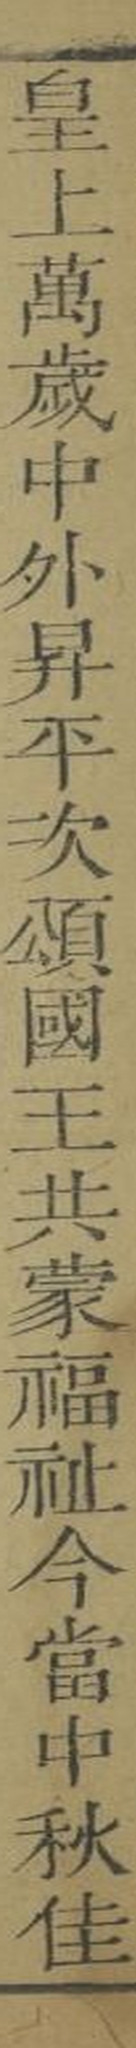皇上萬歲中外昇平次頌國王共蒙福祉今當中秋佳
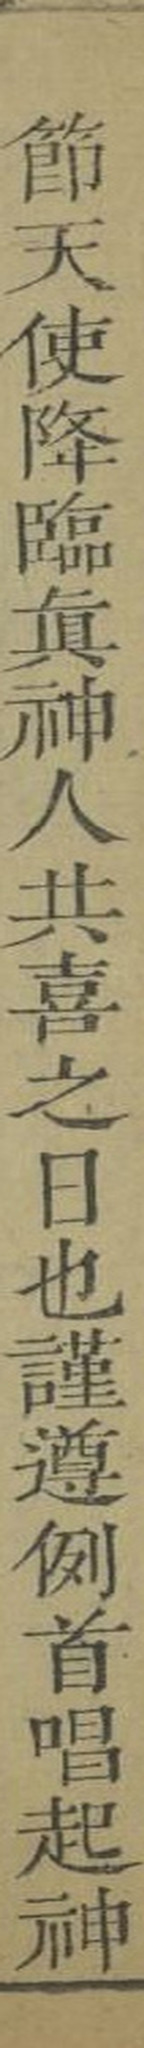節天使降臨眞神人共喜之日也謹遵例首唱起神
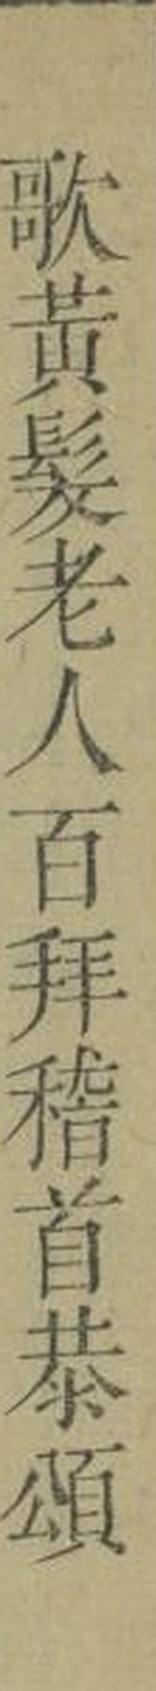歌黃髪老人百拜稽首㳟頌
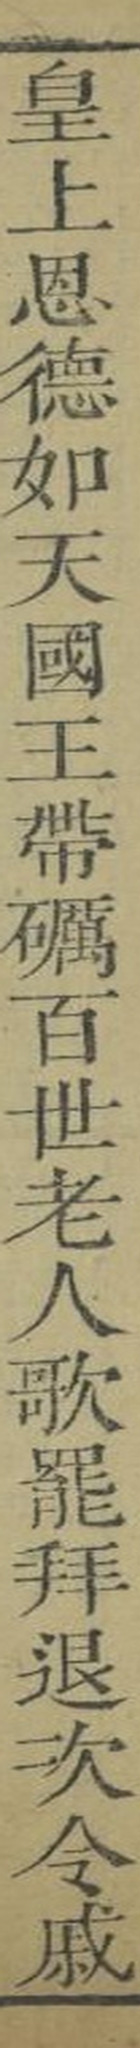皇上恩德如天國王帶礪百世老人歌罷拜退次令戚
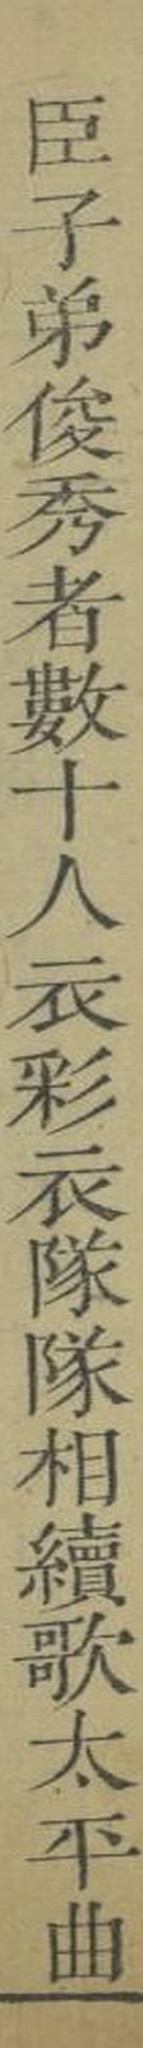臣子弟俊秀者數十人衣彩衣隊隊相續歌太平曲
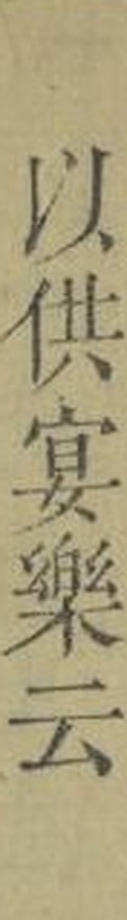以供宴樂云
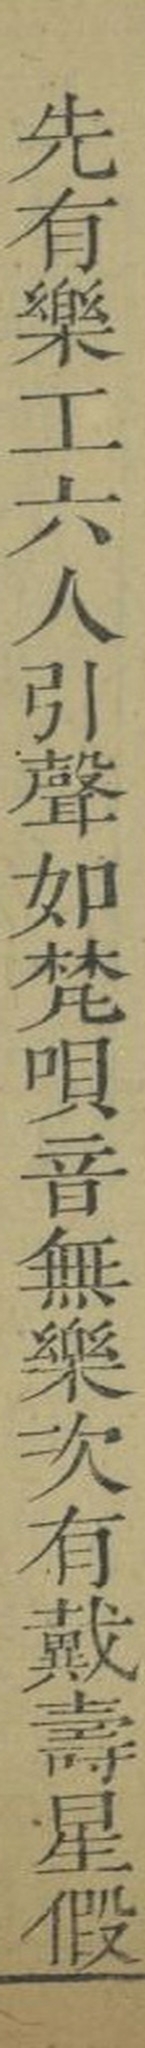先有樂工六人引聲如梵唄音無樂次有戴壽星假
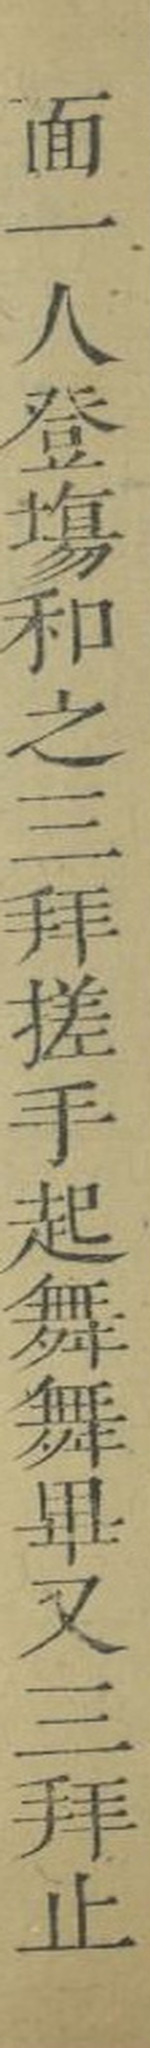面一人登塲和之三拜搓手起舞舞畢又三拜止
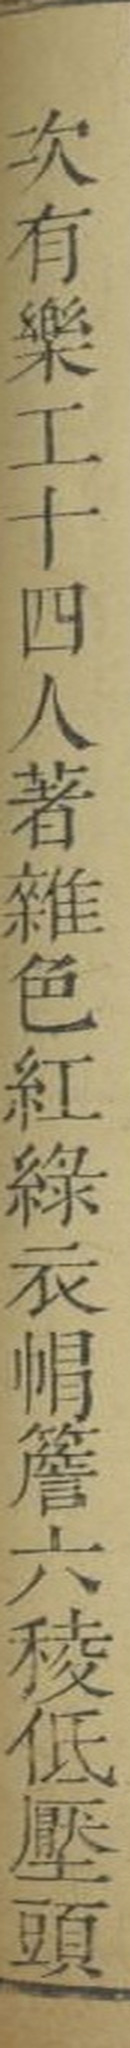次有樂工十四人著雜色紅綠衣帽簷六稜低壓頭
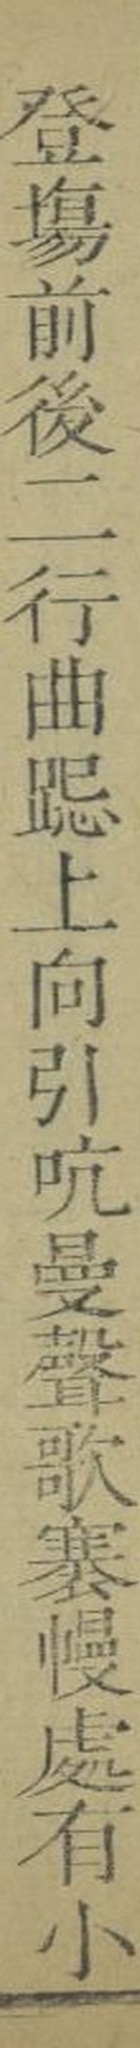登塲前後二行曲跽上向引吭曼聲歌褰幔處有小
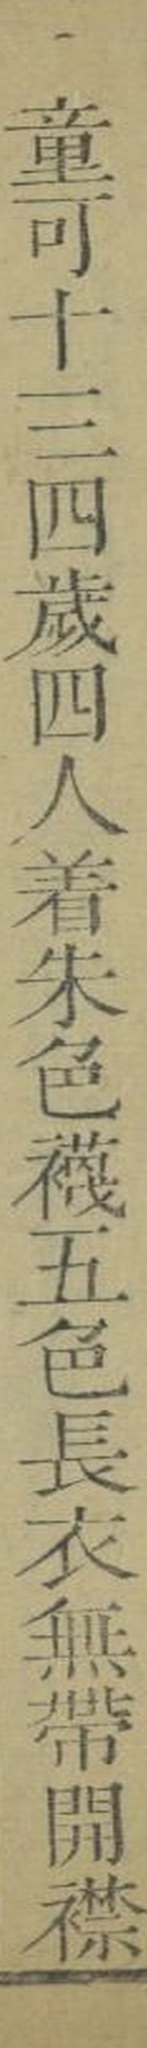童可十三四歲四人着朱色襪五色長衣無帶開襟
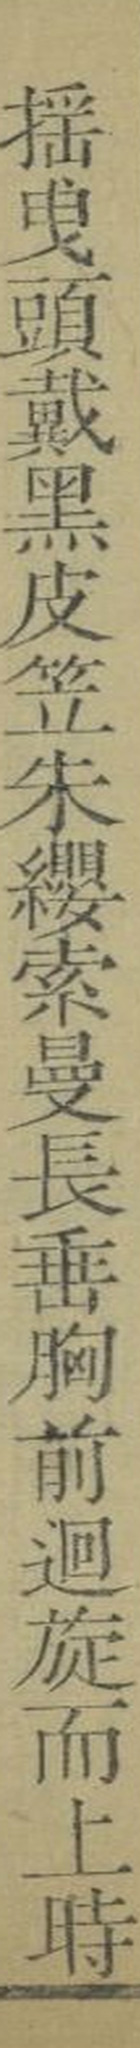揺拽頭戴黑皮笠朱纓索曼長垂胸前廻旋而上時
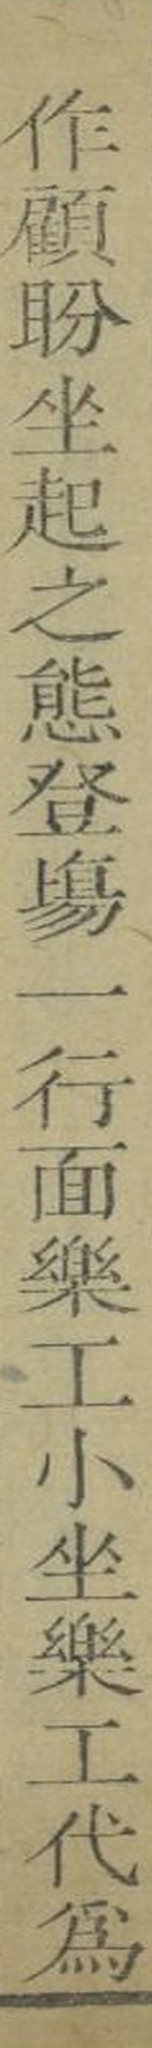作顧盼坐起之態登塲一行面樂工小坐樂工代爲
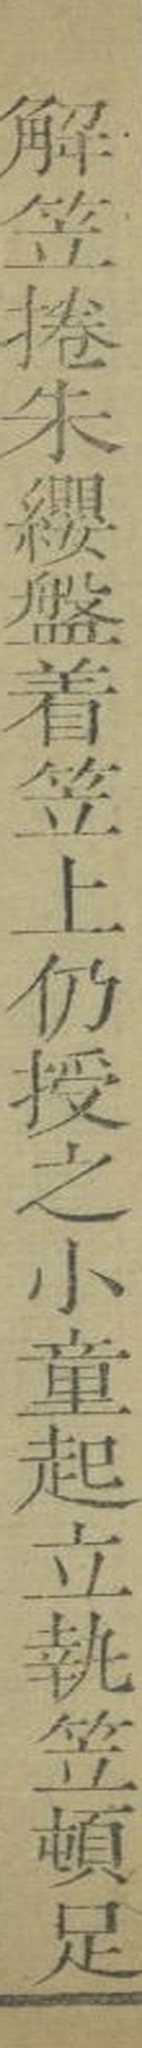解笠捲朱纓盤着笠上仍授之小童起立執笠頓足
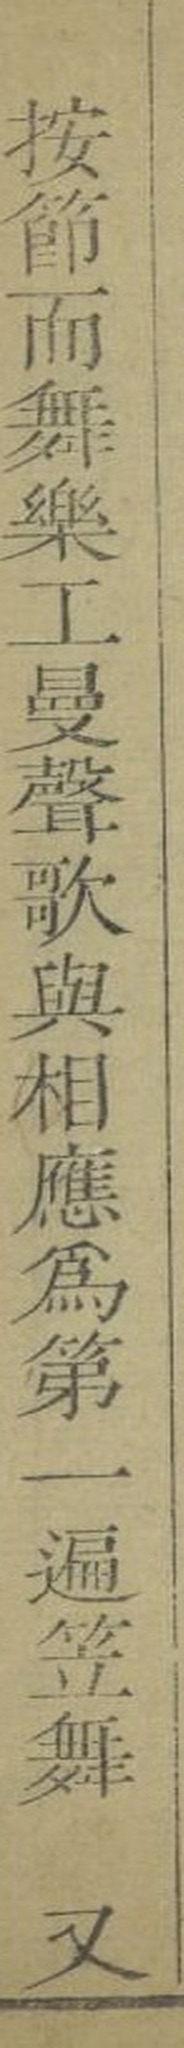按節而舞樂工曼聲歌與相應爲第一遍笠舞又
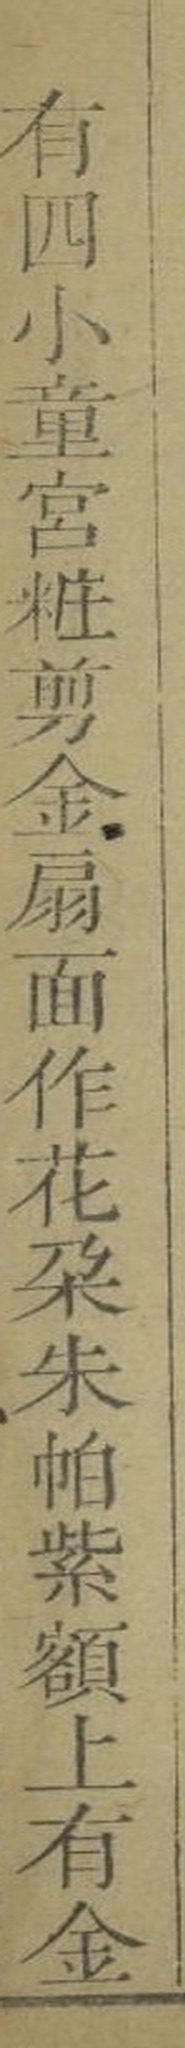有四小童宮粧剪金扇面作花朶朱帕紫額上有金
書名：中山伝信録 巻二
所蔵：University of the Ryukyus Library
